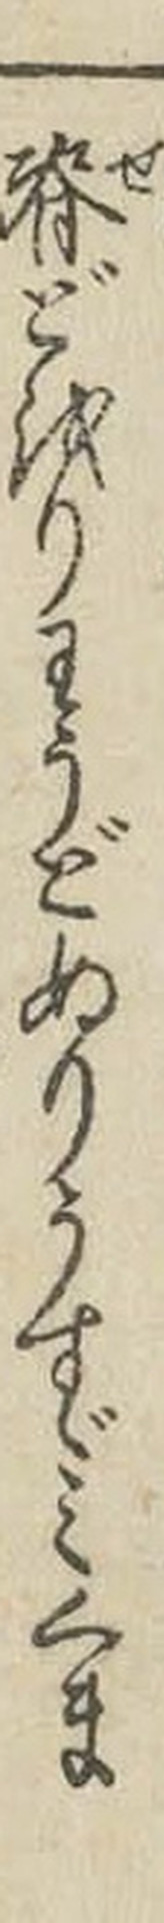脊どをりわうどぬりうすゞみくま
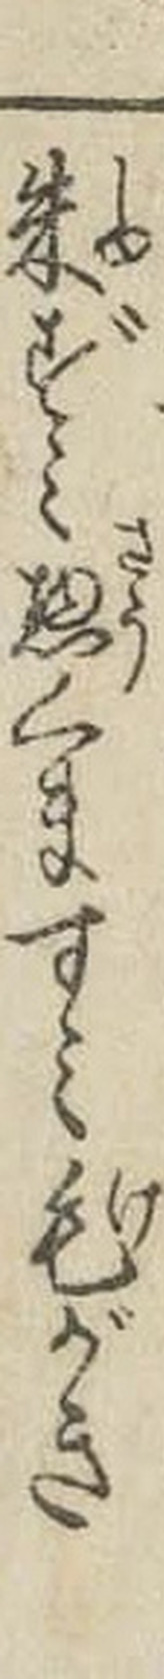朱ずみ総くますみ毛がき
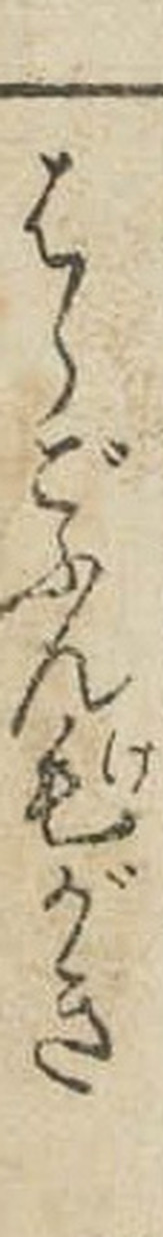はらごふん毛がき
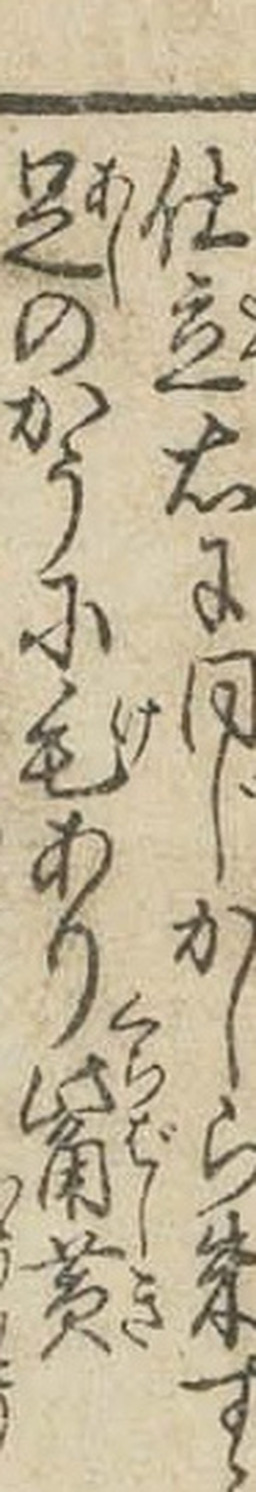足のかうに毛あり觜黄
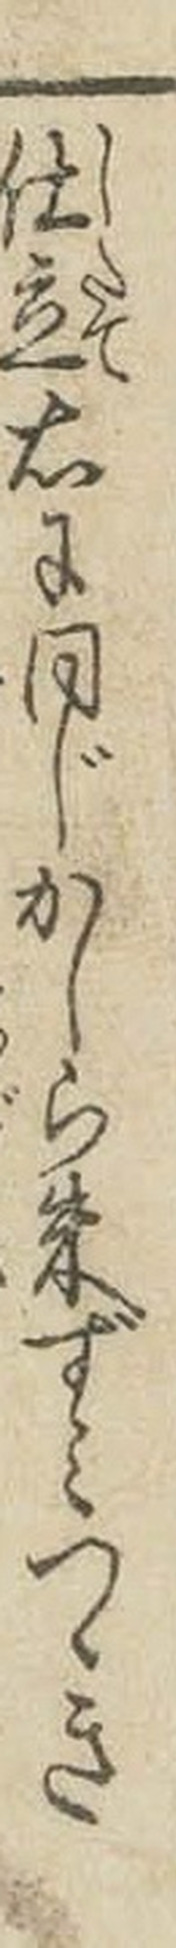仕立右に同じかしら朱ずみつゝき
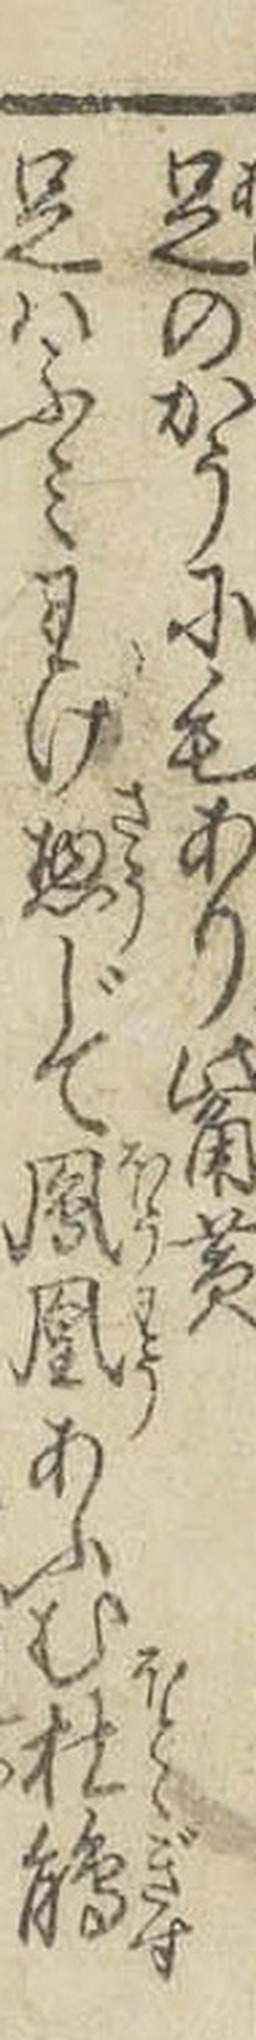足はふみわけ総じて鳳凰あふむ杜鵑
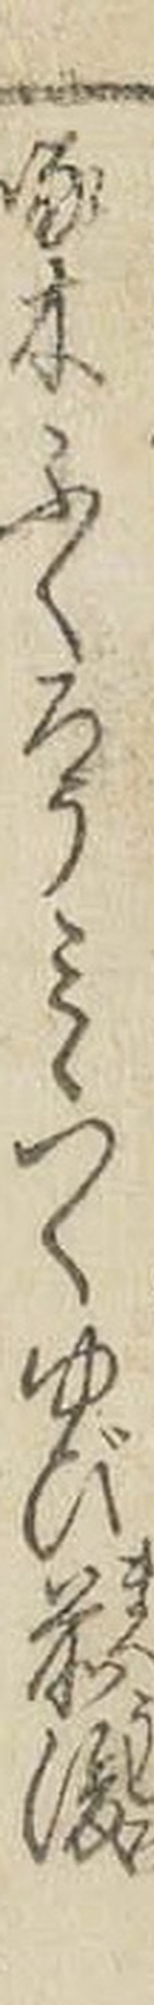啄木ふくろうみゝつくゆび前後
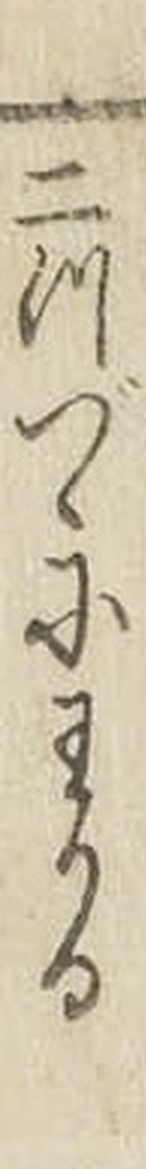二つづゝにわかる

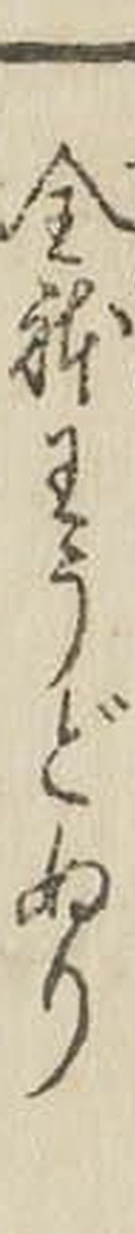全体わうどぬり
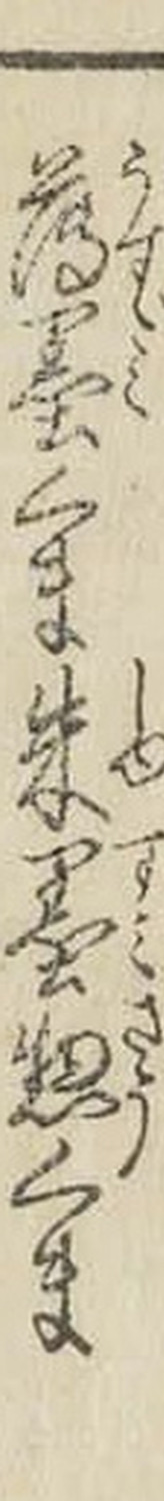薄墨くま朱墨総くま
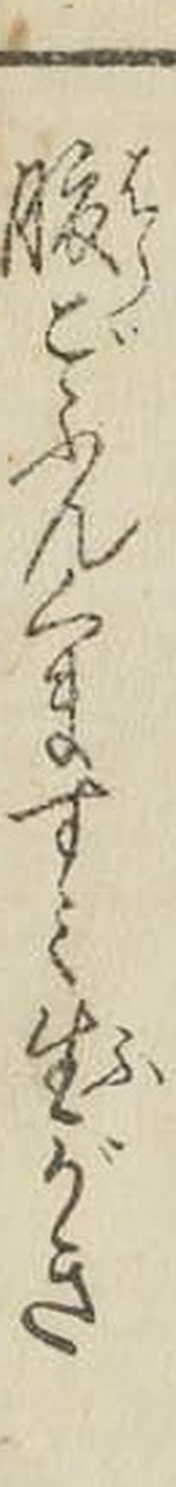腹ごふんくますみ生がき
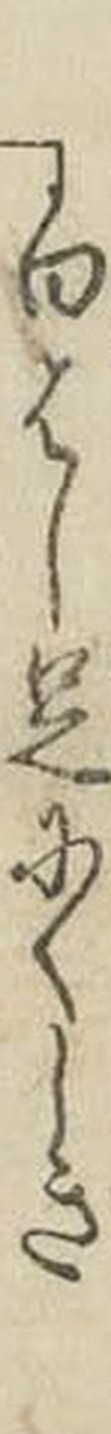白はし足にくしき
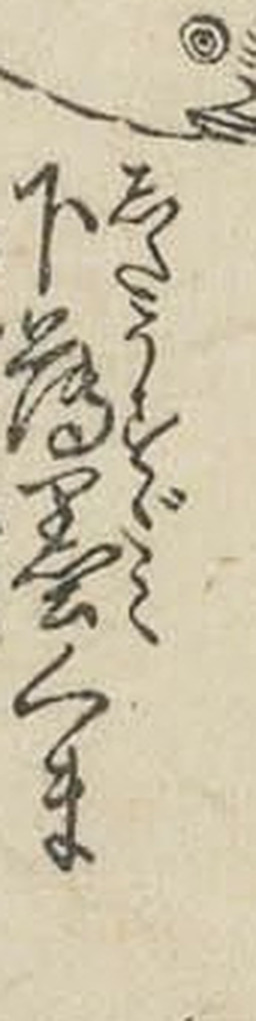下薄墨くま
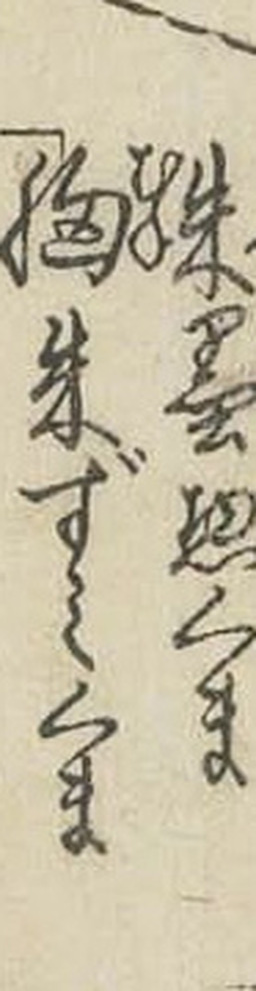くま胸朱ずみくま
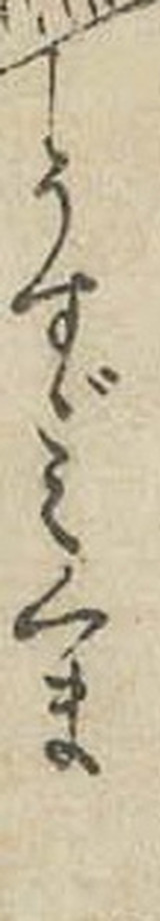うすゞみくま
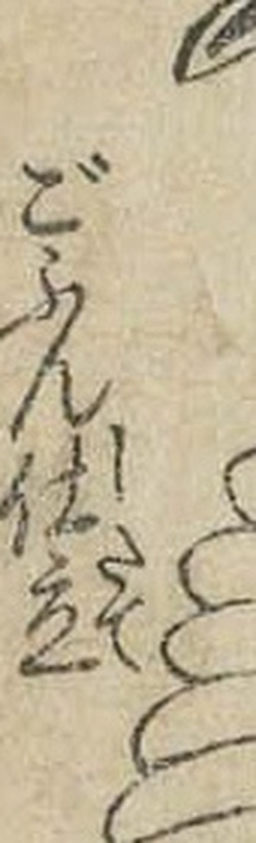ごふん仕立
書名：絵本写宝袋 9巻 8之巻
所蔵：東京学芸大学教育コンテンツアーカイブ
